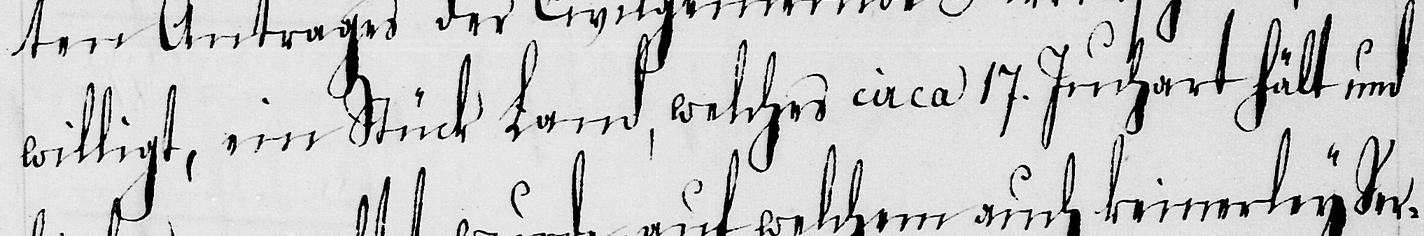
ewilligt, ein Stück Land, welches circa 17. Juchart hält und
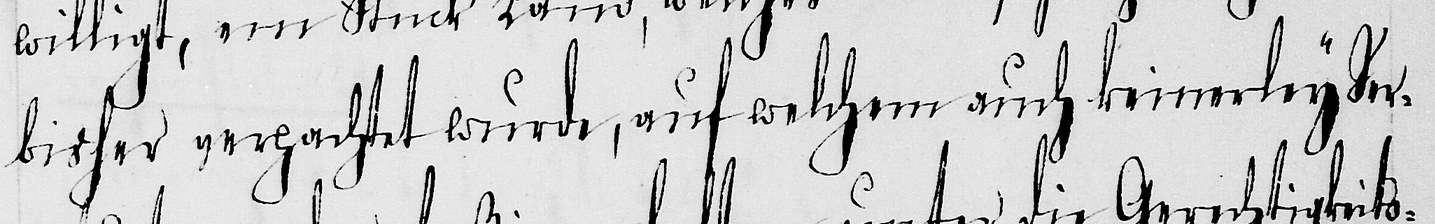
bisher verpachtet wurde, auf welchem auch keinerley Ser¬
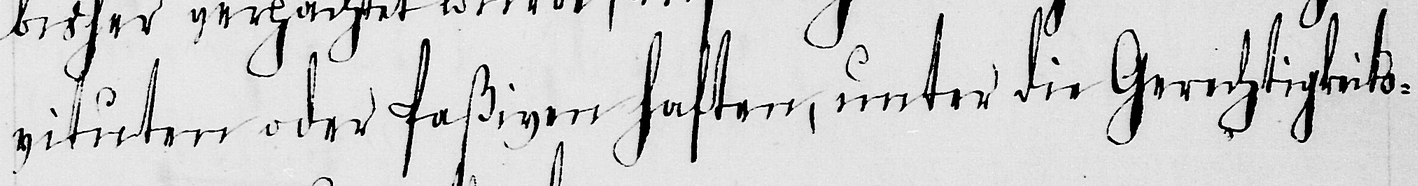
vituten oder Paßiven haften, unter die Gerechtigkeit¬
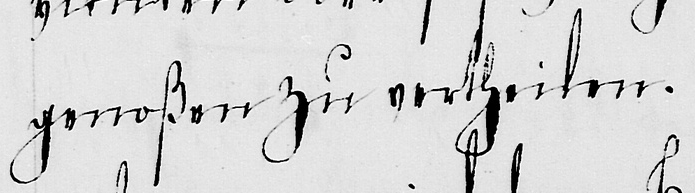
sgenoßen zu vertheilen.
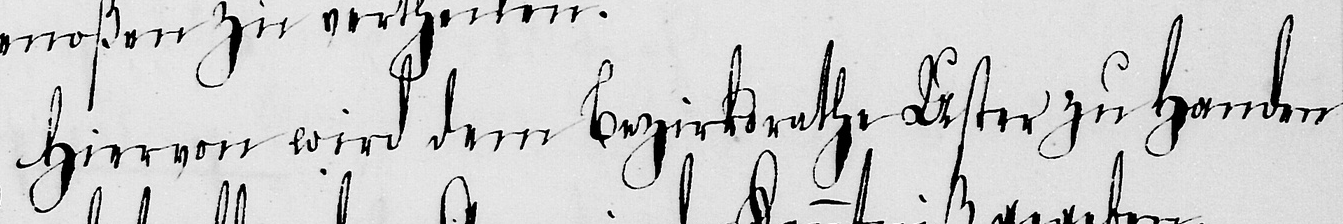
Hiervon wird dem Bezirksrathe Uster zu Handen
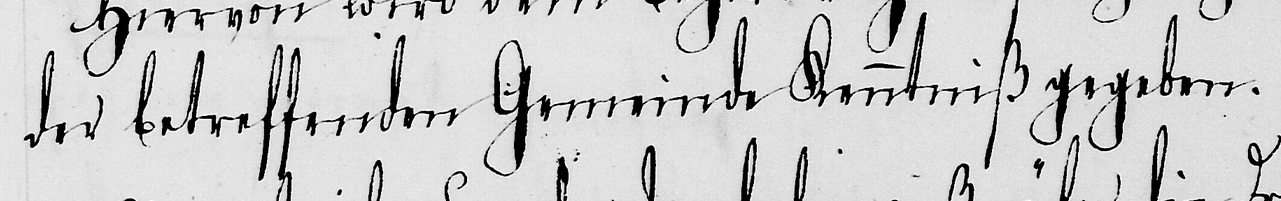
der betreffenden Gemeinde Kenntniß gegeben.
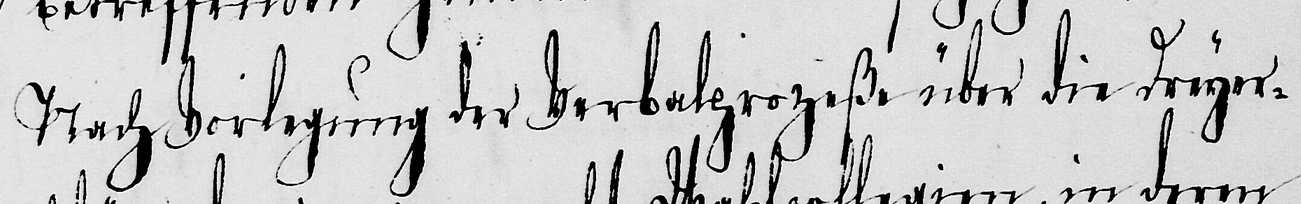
Nach Vorlegung der Verbalprozeße über die Dreyer¬
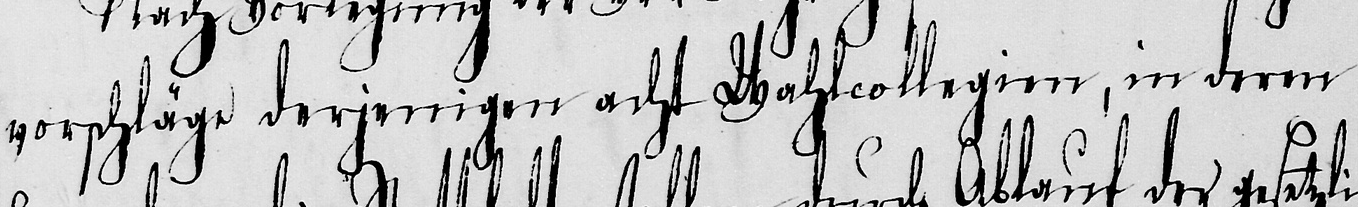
vorschläge derjenigen acht Wahlcollegien, in deren
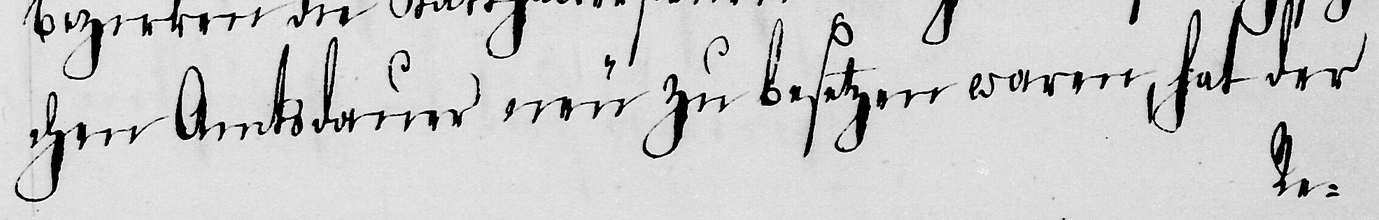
chen Amtsdauer neu zu besetzen waren, hat der
